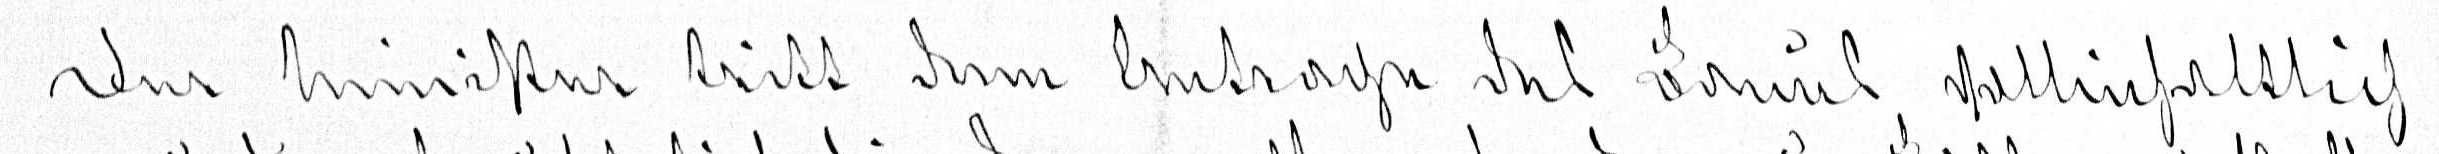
Der Minister tritt de Antrage des Banus vollinhaltig
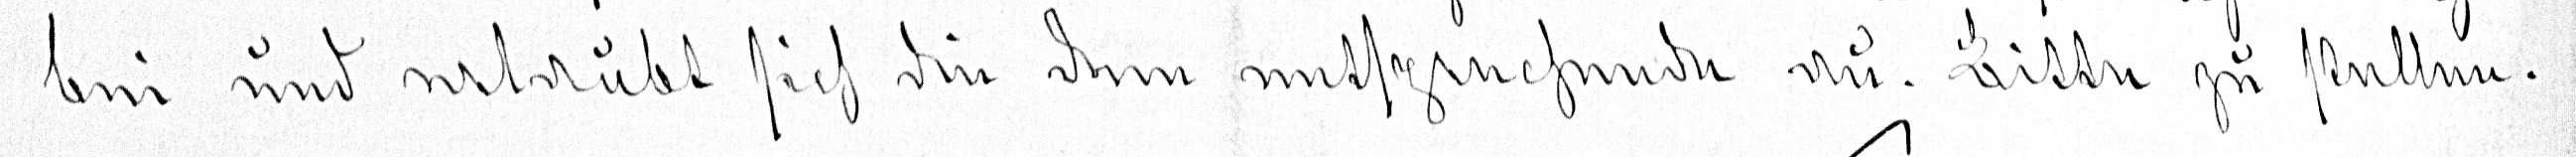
bei und erlaubt sich die dem entsprechende au. Bitte zu stellen.
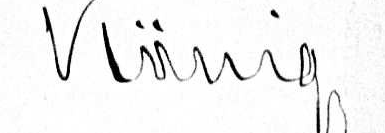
König
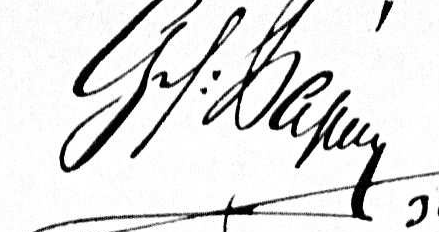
Ges Papay
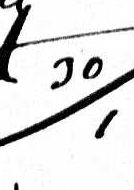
30/1
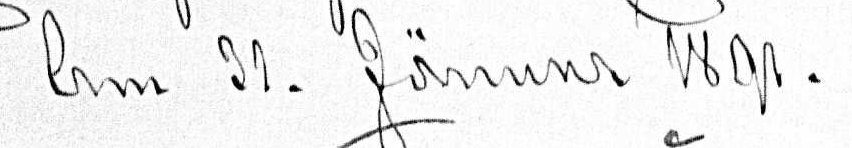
Am. 31 Jänner 1891
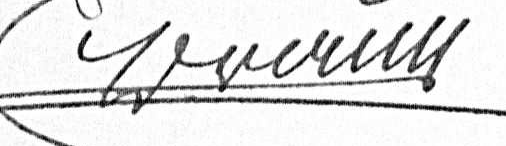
Braun
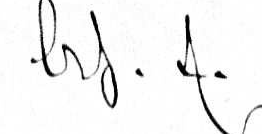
Ah. E.
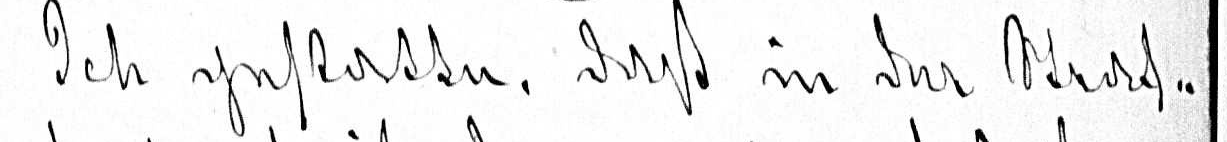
Ich gestatte, daß in der Straf¬
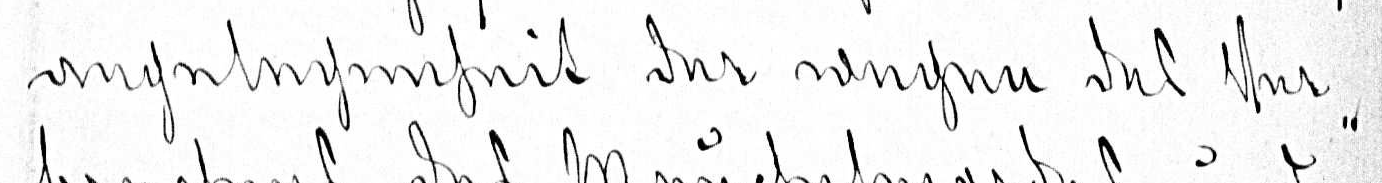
angelegenheit der wegen des Ver¬
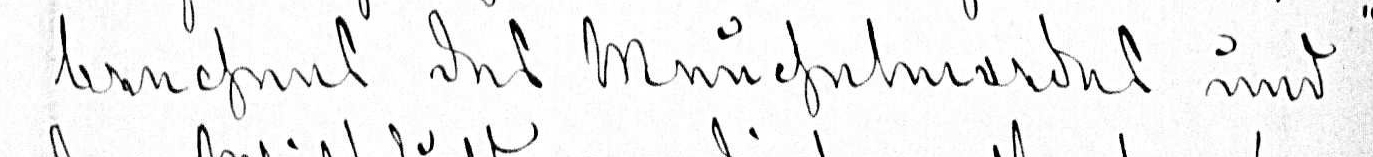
brechens des Meuchelmordes und
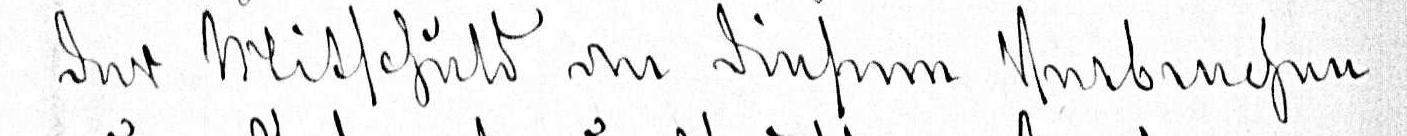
der Mitschuld an diesem Verbrechen
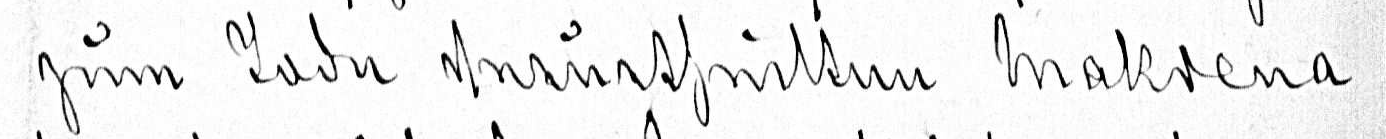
zum Tode verurtheilten Makrena
